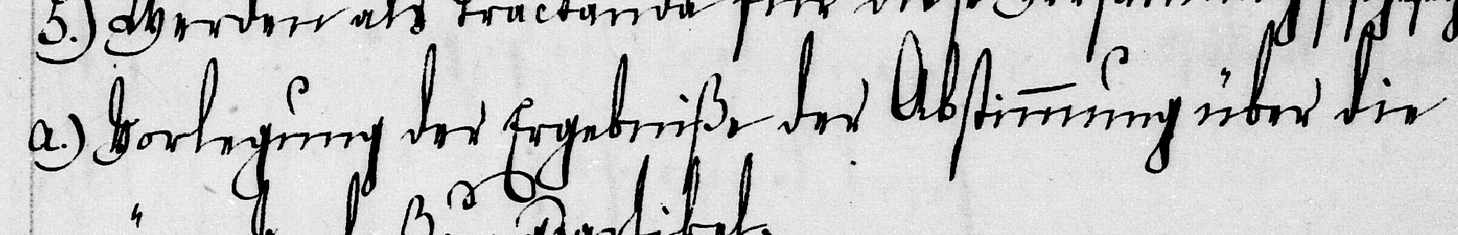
a.) Vorlegung der Ergebniße der Abstimmung über die
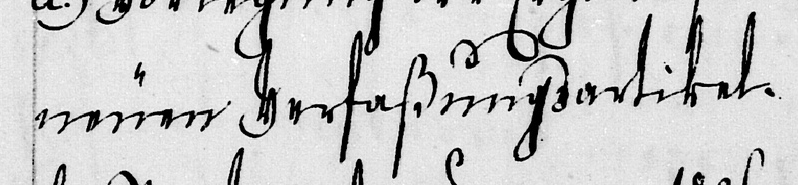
neuen Verfaßungsartikel.
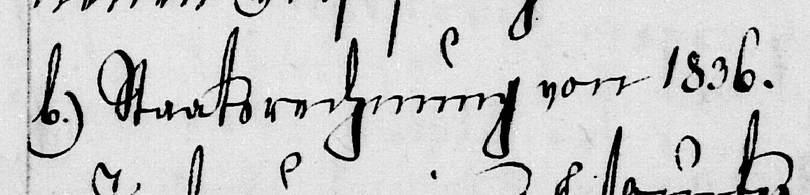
b.) Staatsrechnung von 1836.
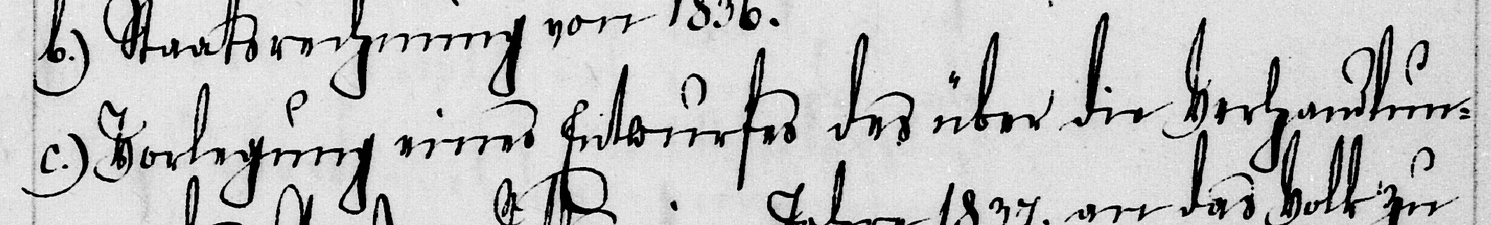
c.) Vorlegung eines Entwurfes des über die Verhandlun¬
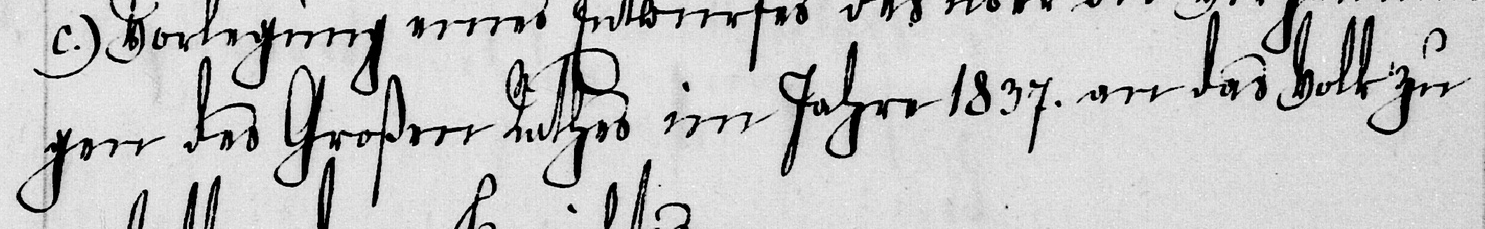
gen des Großen Rathes im Jahre 1837. an das Volk zu
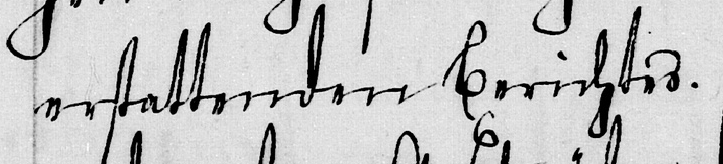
erstattenden Berichtes.
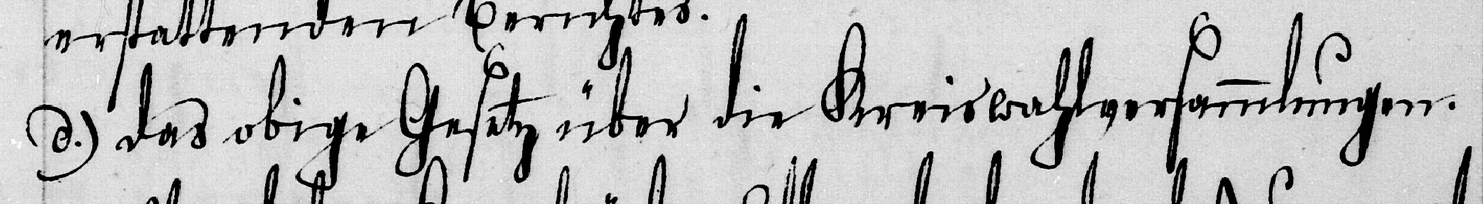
d.) das obige Gesetz über die Kreiswahlversammlungen.
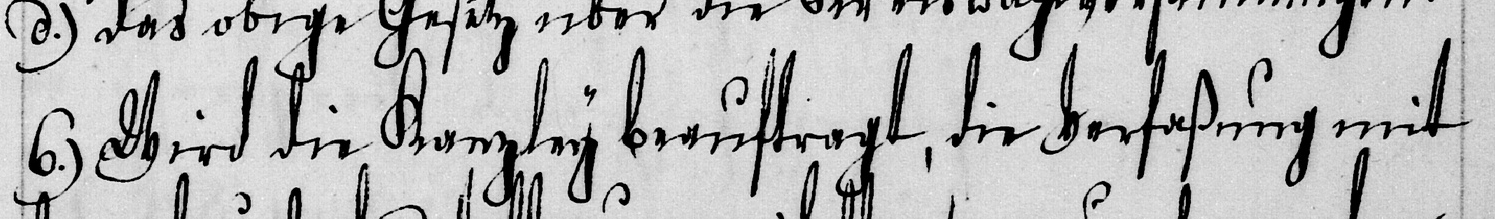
6.) Wird die Kanzley beauftragt, die Verfaßung mit
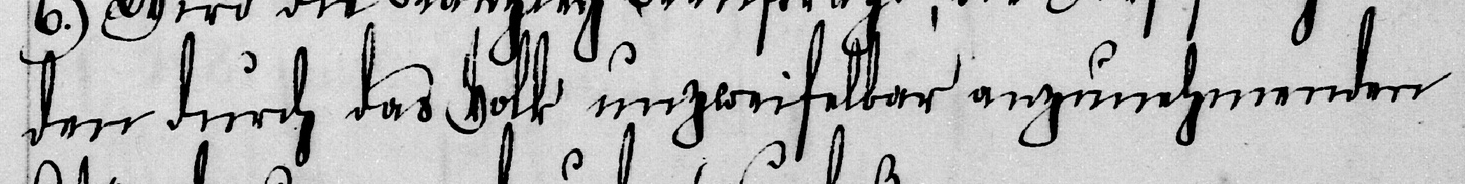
den durch das Volk unzweifelbar anzunehmenden
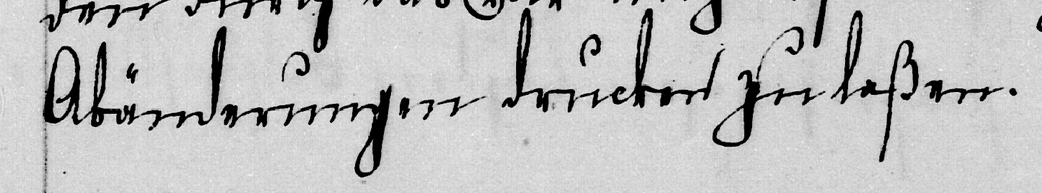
Abänderungen drucken zu laßen.
